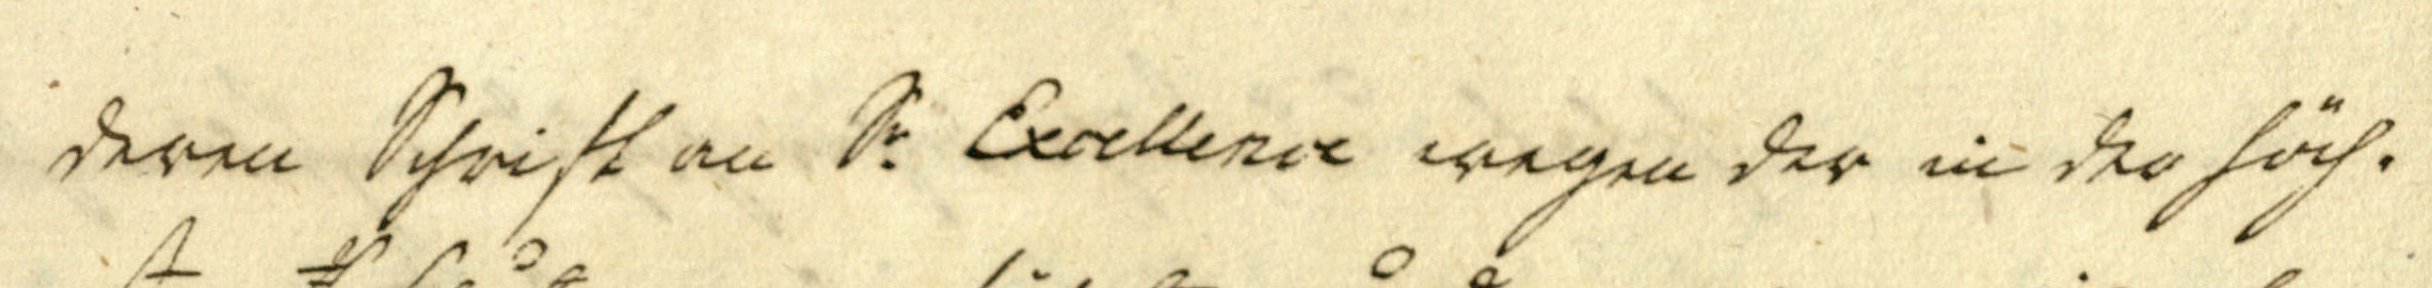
deren Schrift an Sr Excellence wegen der in der höch¬
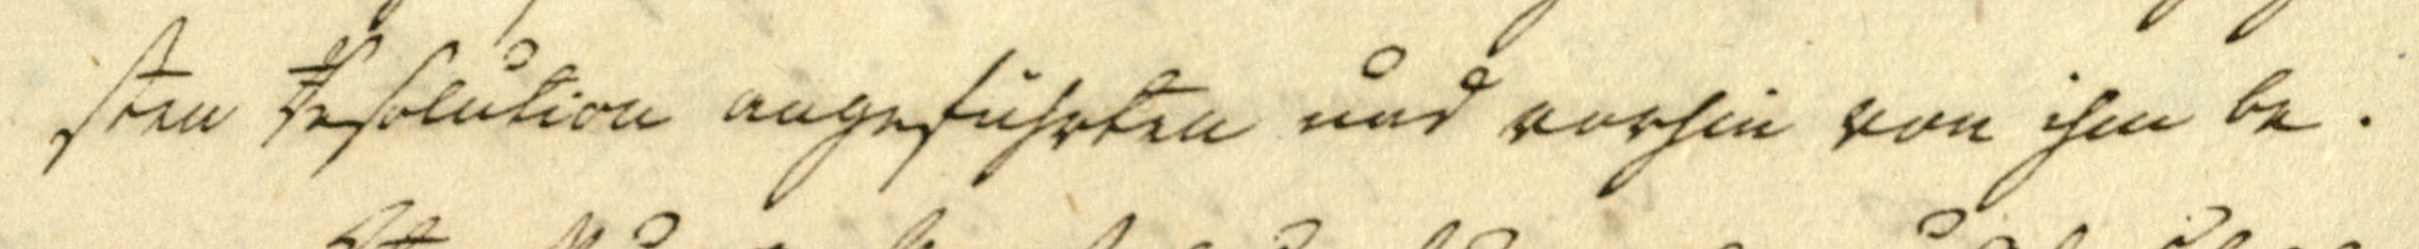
sten Resolution angeführten und vorhin von ihm be¬
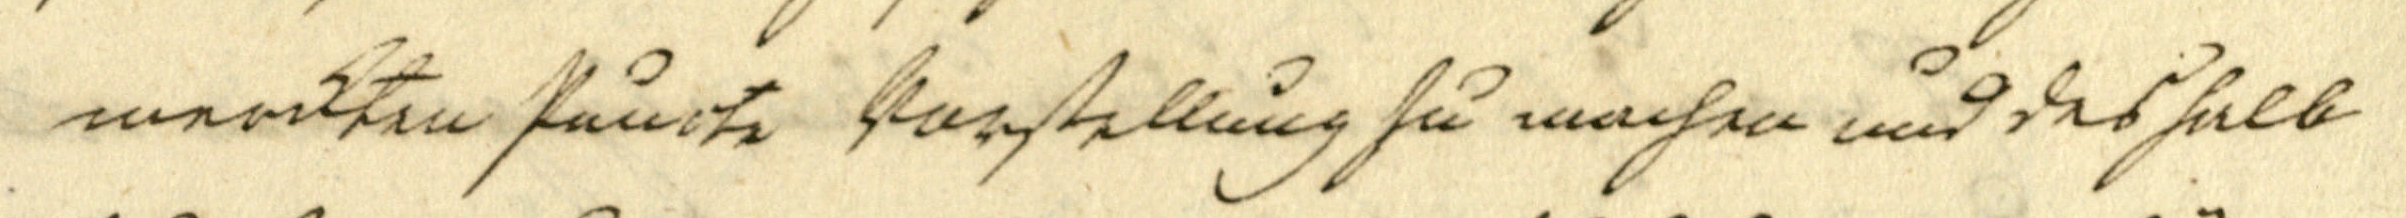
merckten Puncte Vorstellung zu machen und deshalb
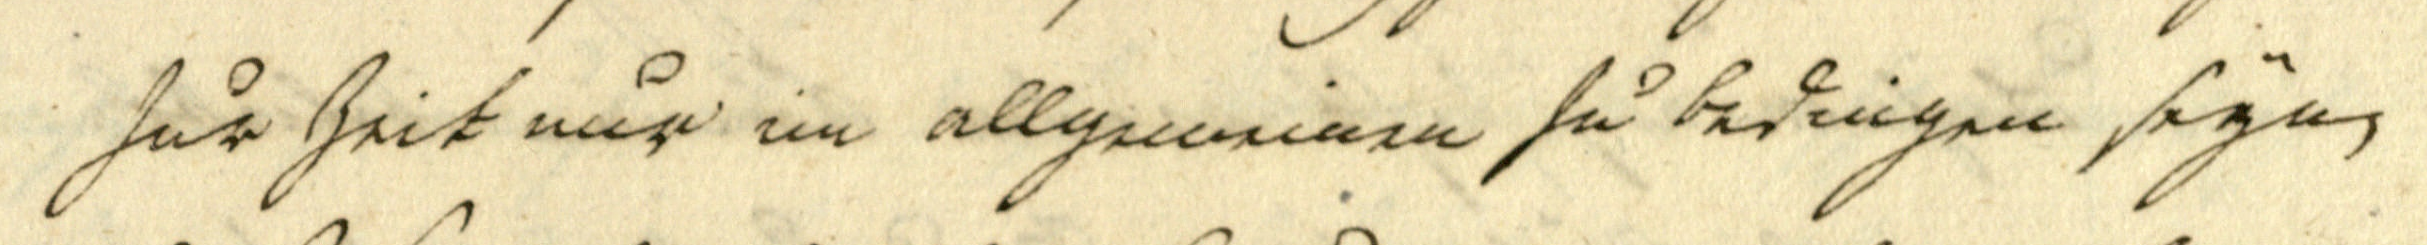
zur Zeit nur im allgemeinen zu bedingen seÿn,
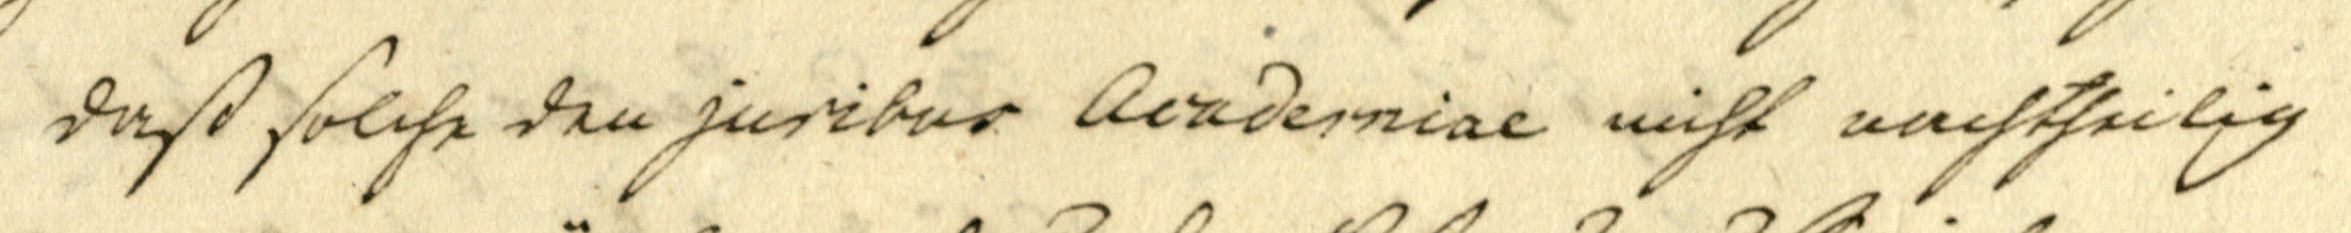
daß solche den juribus Academiae nicht nachtheilig
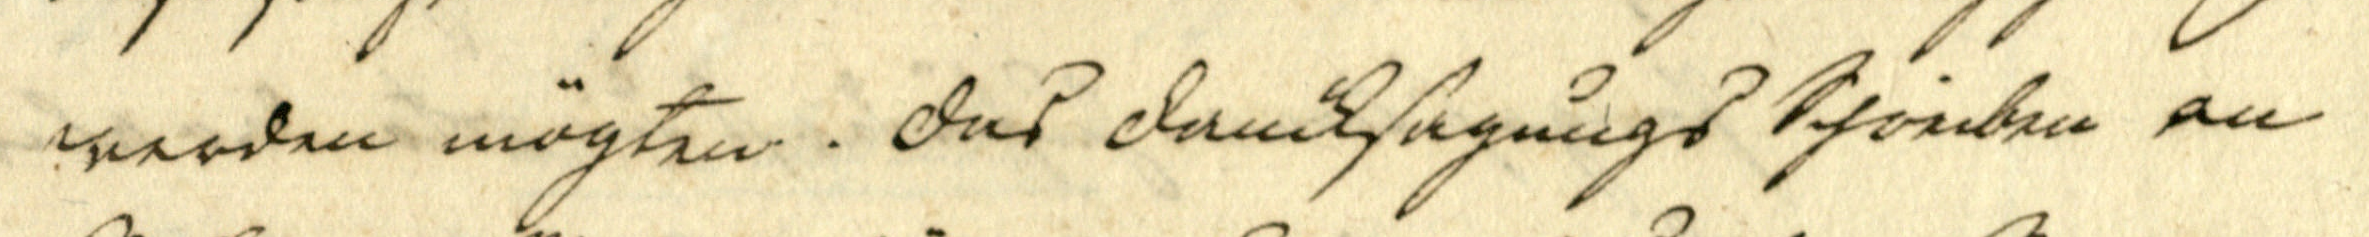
werden mögten. Das Dancksagungs Schreiben an
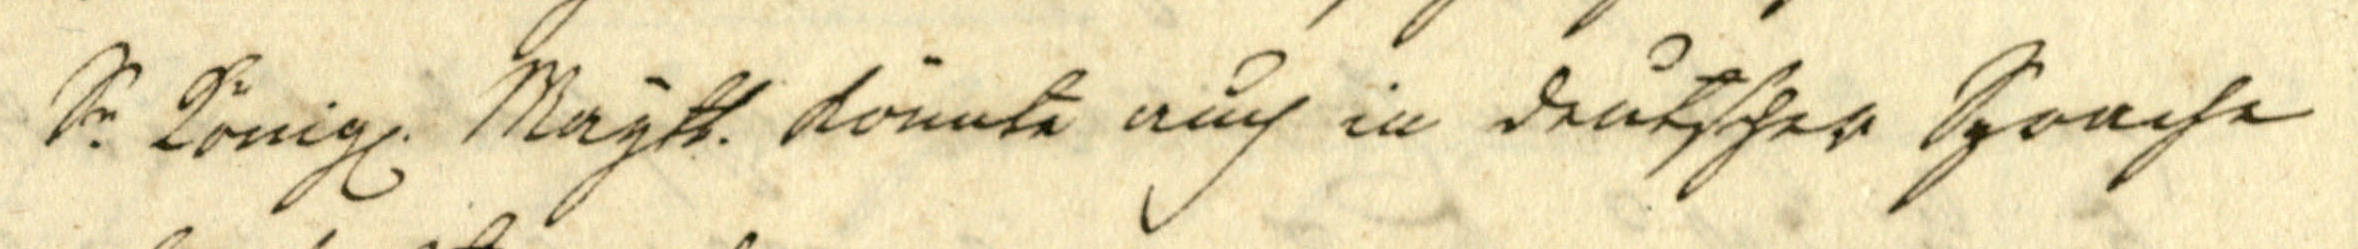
Sr. Königl. Maÿtt. könnte auch in deutscher Sprache
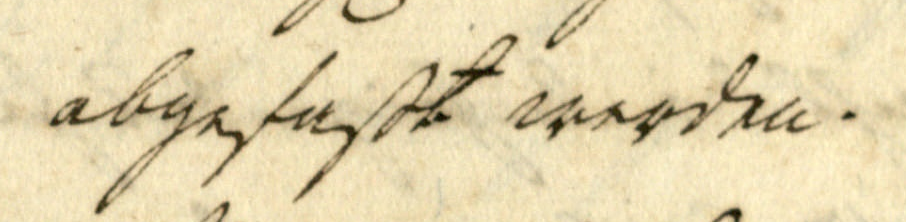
abgefaßt werden.
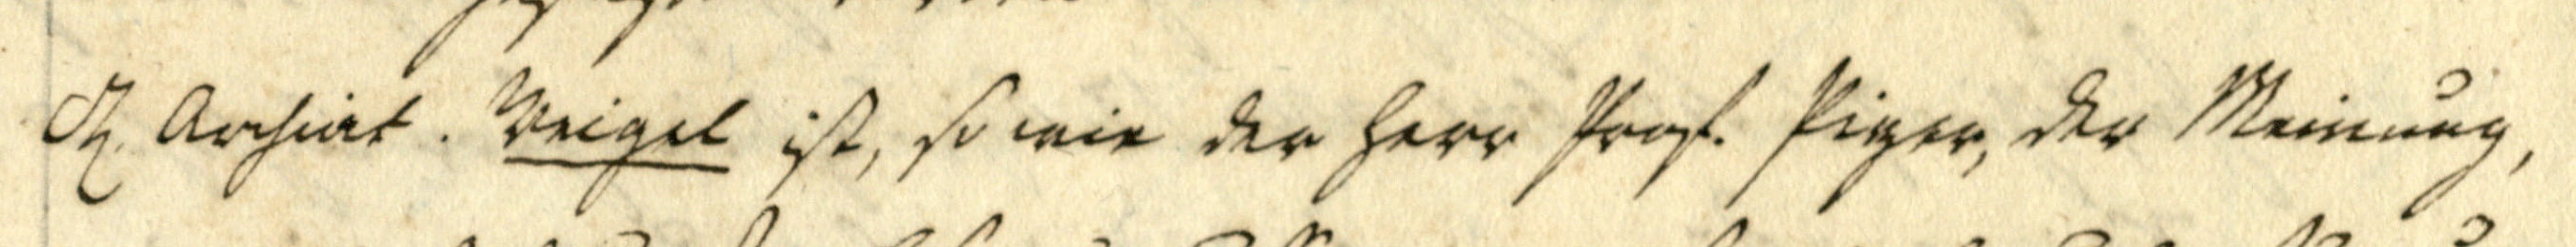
dh. Archiat. Weigel ist, so wie der Herr Prof. Piper, der Meinung,
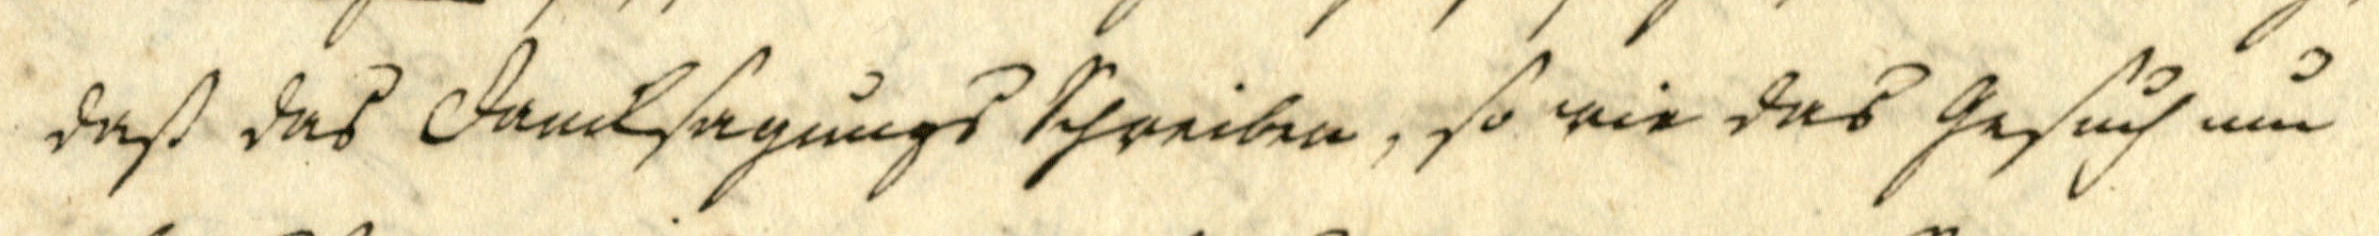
daß das Dancksagungs Schreiben, so wie das Gesuch um
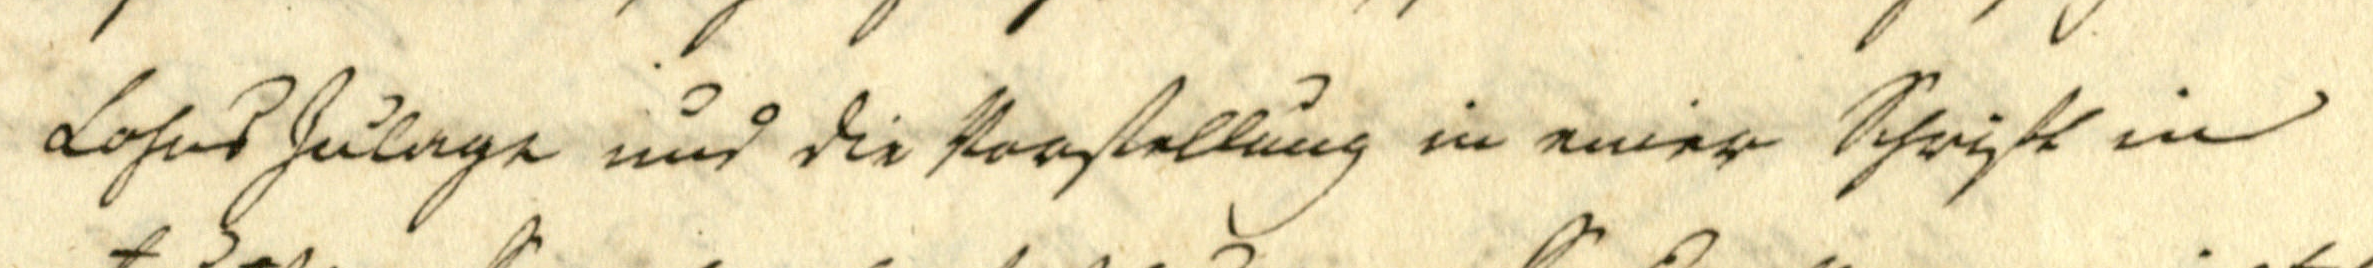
Lohns Zulage und die Vorstellung in einer Schrift in
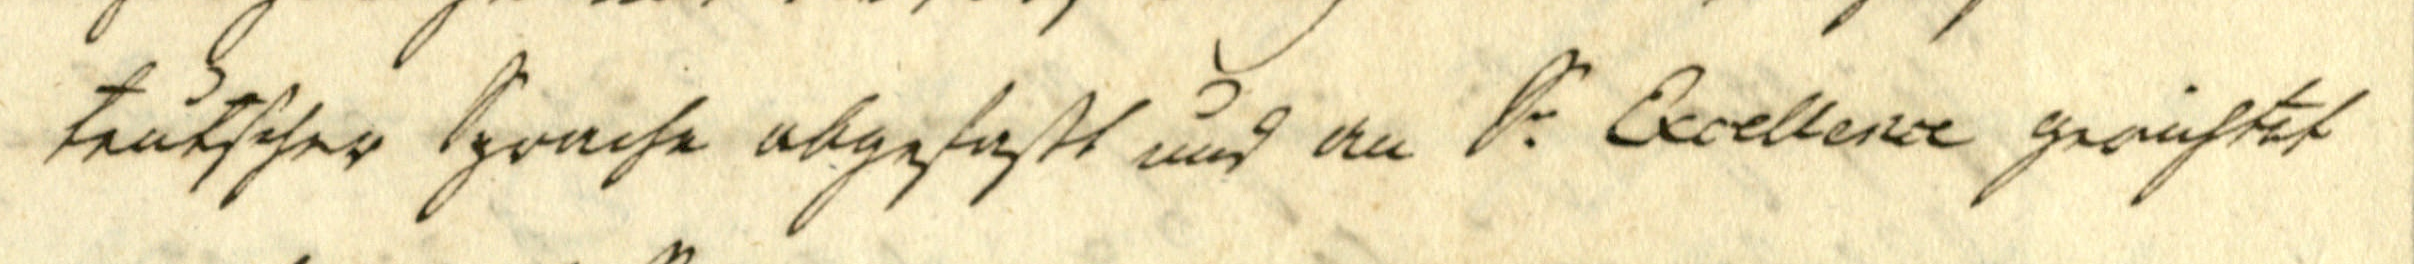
teutscher Sprache abgefaßt und an Sr Excellence gerichtet
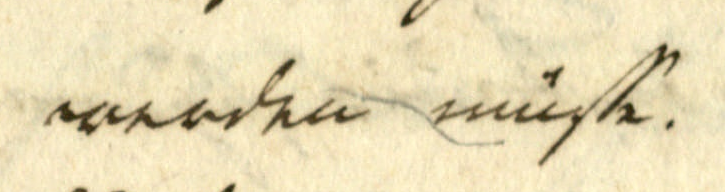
werden müsse.
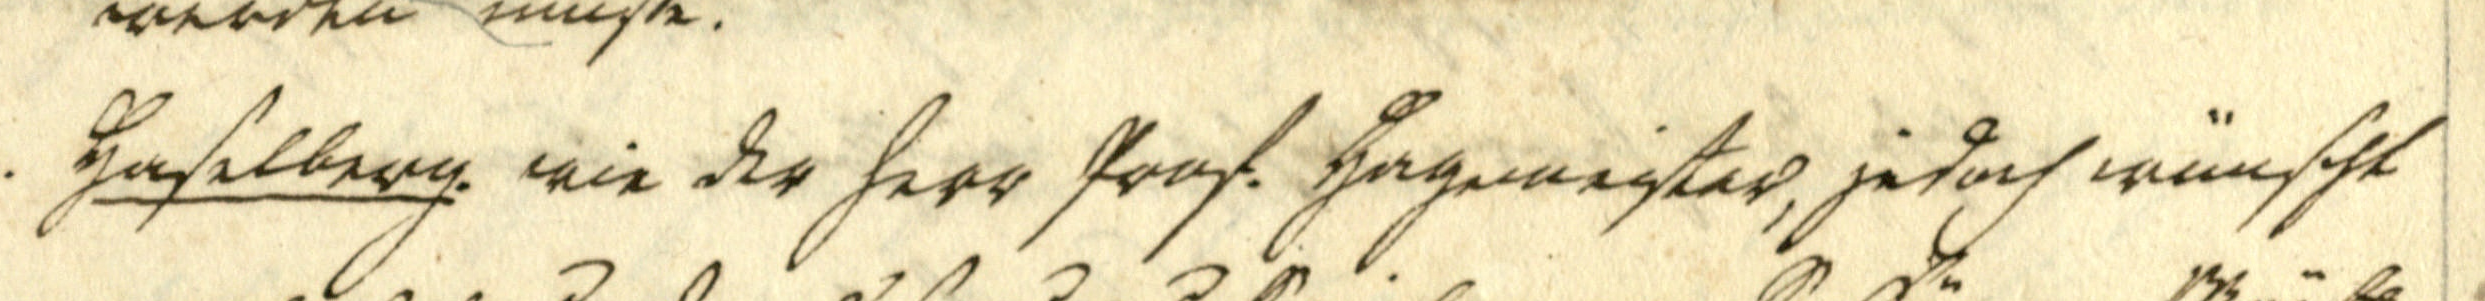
Haselberg. wie der Herr Prof. Hagemeister, jedoch wünscht
